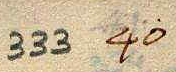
40
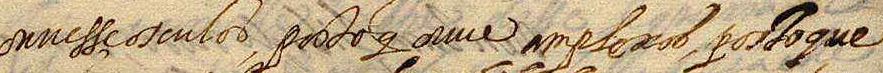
ouvesse osculos, posto q̄ ouue amplexos, posto que
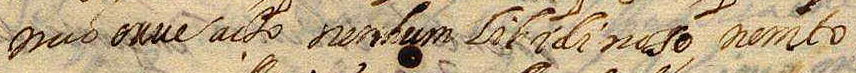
naõ ouue acto nenhum libidinoso, nem to
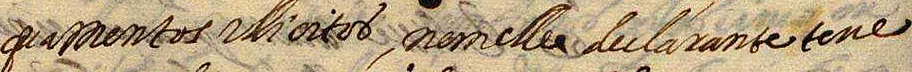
quamentos illicitos, nem elle declarante teve
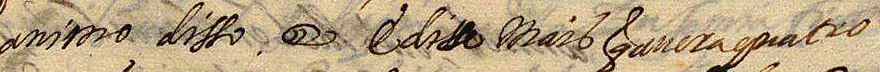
animo disso. E disse mais q̄ auera quatro
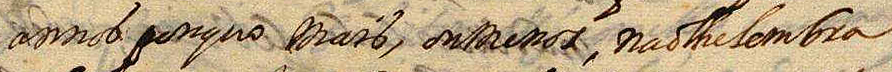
annos pouquo mais, ou menos, não lhe lembra
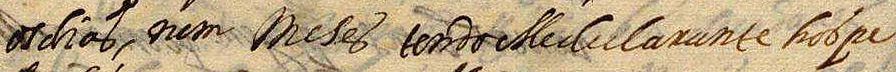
os dias, nem meses tendo elle declarante hospe
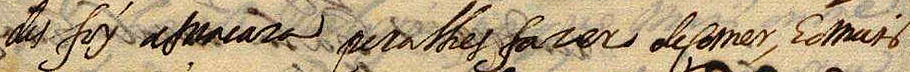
des foy a sua caza pera lhes fazer de comer, e o mais
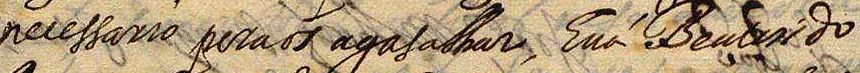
necessario pera os agasalhar, huā Beatris do
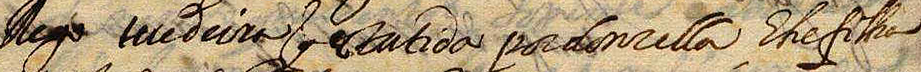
Rego tecedeira q̄ esta tida por donzella, e he filha
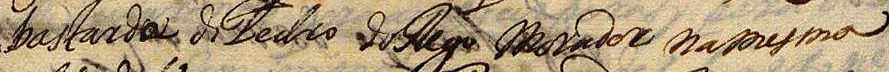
bastarda de Pedro Rego, morador na mesma
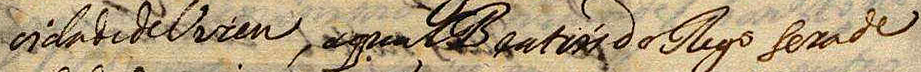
cidade de Vizeu, a qual Beatriz do Rego sera de
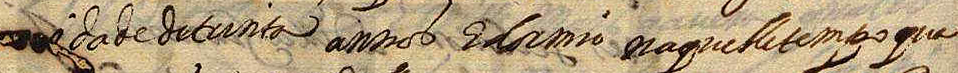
idade de trinta annos e dormio naquelle tempo qua
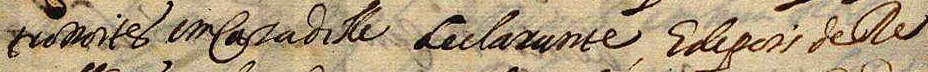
tro noites em Caza delle declarante, e depois de Re
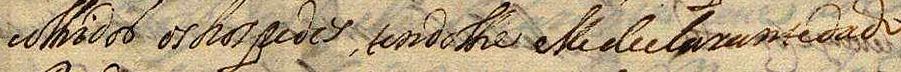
colhidos os hospedes, tendolhe elle declarante dado
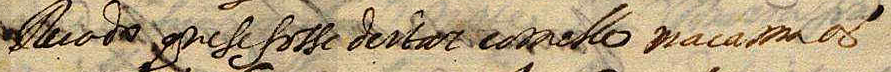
Recado que se fosse deitar com elle na cama as
